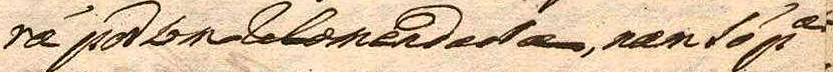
rá por vm ReComendada, nam só pa
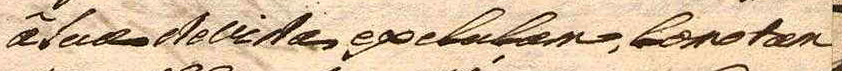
á sua devida exeCuÇam, Como tam
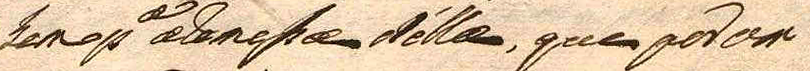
bem pa a Remessa délla, que por vm
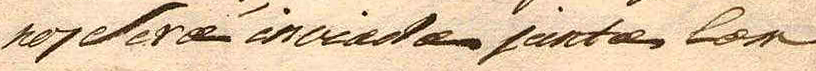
nos será inviada junta com
